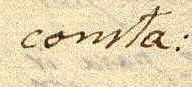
consta:
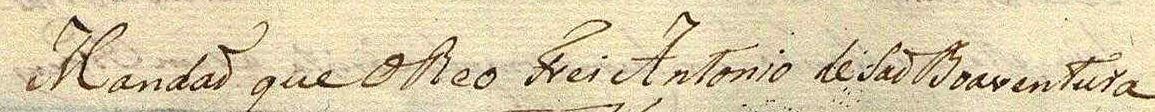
Mandaõ que o Reo Frei Antonio de Saõ Boaventura
